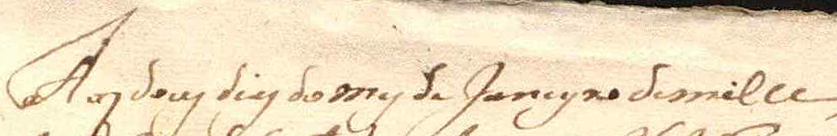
Aos dous dias do mes de Janeyro de mil ce
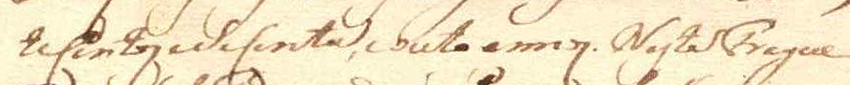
teCentos e seCenta, e outo annos. Nesta Fregue
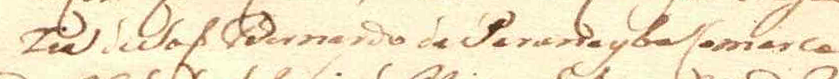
Zia de Saõ Bernardo da Paranayba Comarca
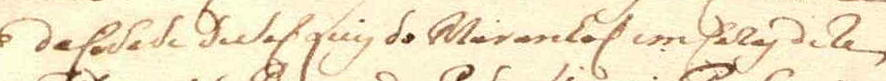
da Cidade de Saõ Luis do Maranhaõ em Cazas de Re
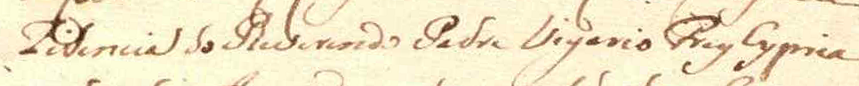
Zidencia do Reverendo Padre Vigario Frey Cypria
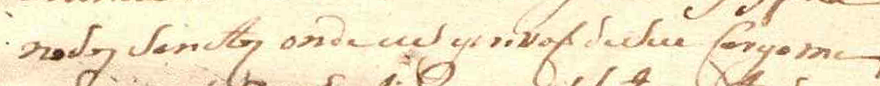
no dos Sanctos onde eu escrivaõ de seu Cargo me
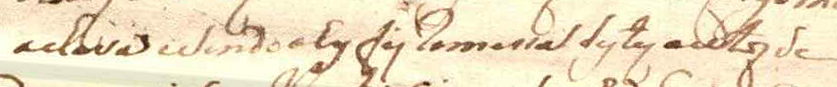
achava, e sendo ahy fis Remessa destes autos de
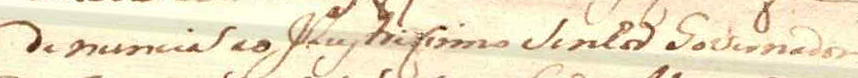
denuncia ao Jlustrissimo Senhor Governador
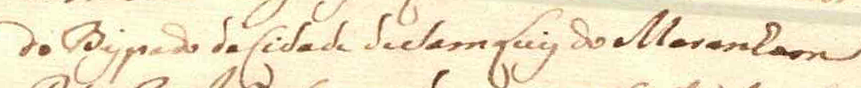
do Bispado da Cidade de Sam Luis do Maranham
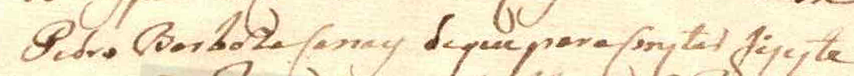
Pedro Barboza Canais de que para Constar fis este
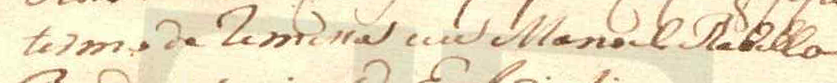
termo de Remessa e eu Manoel Rabello
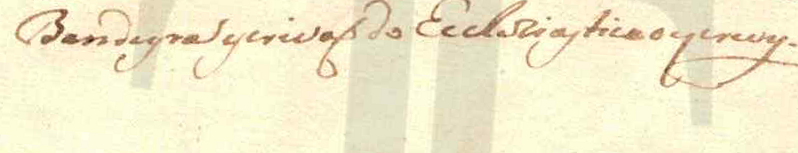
Bandeyra escrivaõ do Eccleziastico o escrevy.
